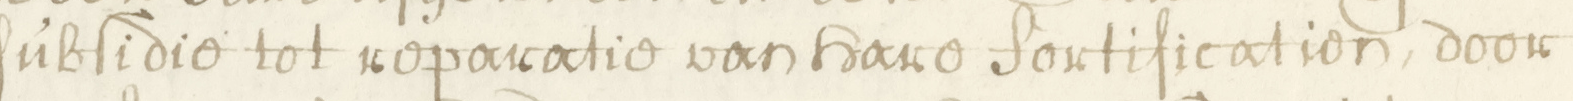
subsidie tot reparatie van hare fortificatien, door
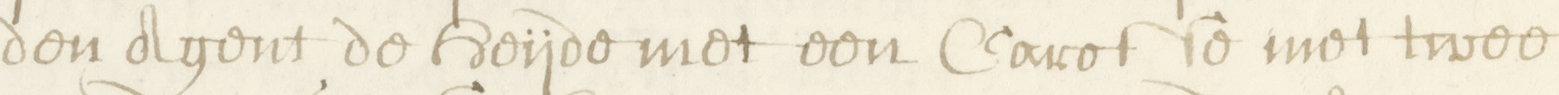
den Agent de Heijde met een Carosse met twee
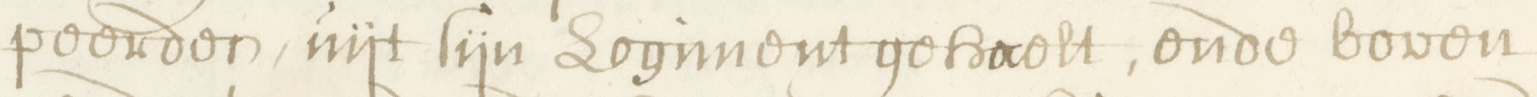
peerden, uijt sijn Logiment gehaelt, ende boven
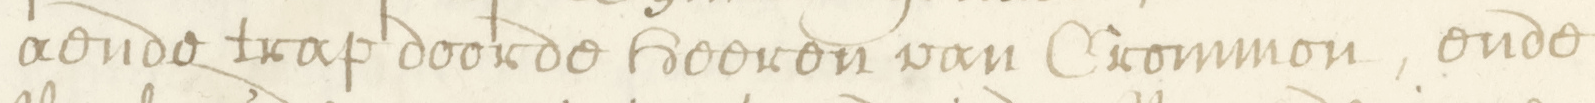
aende trap door de heeren van Crommon, ende
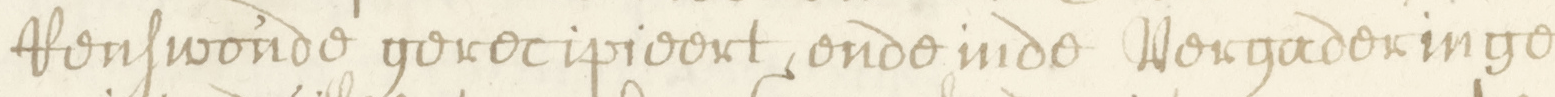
Renswoude gerecipieert, ende inde Vergaderinge
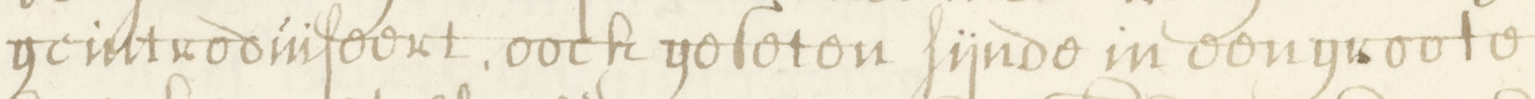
geintroduiseert, oock geseten sijnde in een groote
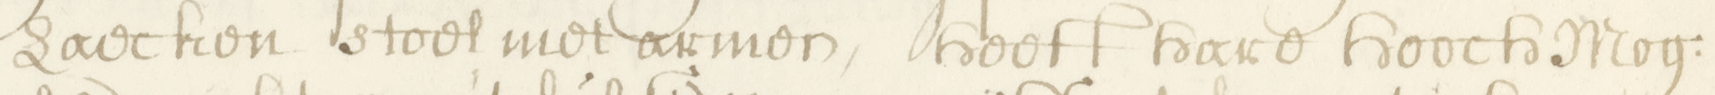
laecken stoel met armen, heeft hare hooch Mog:
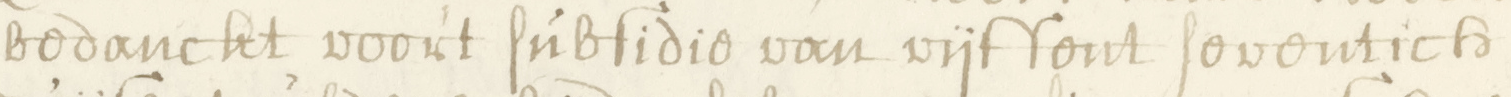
bedanckt voor‛t subsidie van vijffent seventich
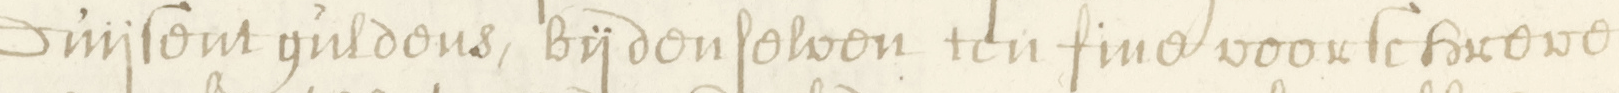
Duijsent guldens, bij denselven ten fine voorschreve
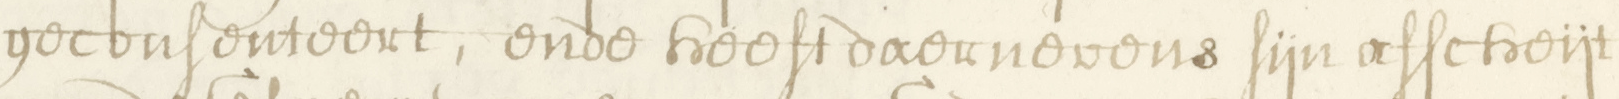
geconsenteert, ende heeft daernevens sijn afscheijt
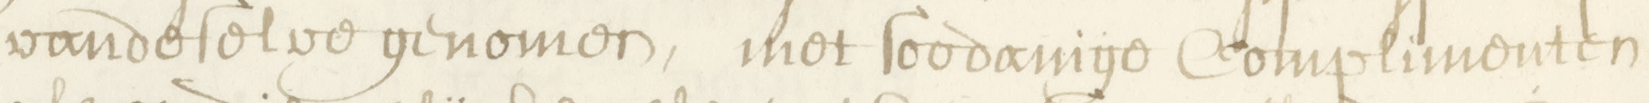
van deselve genomen, met soodanige Complimenten
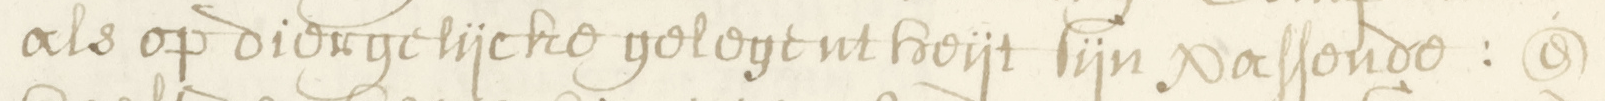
als op diergelijcke gelegentheijt sijn passende: &
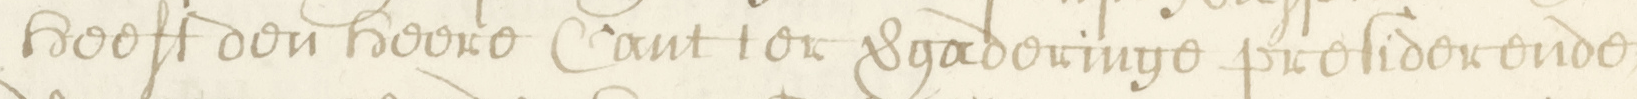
heeft den heere Cant ter vgaderinge presiderende,
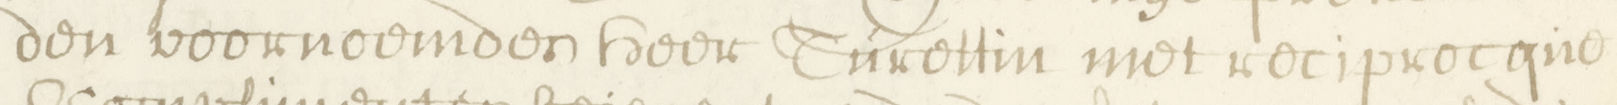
den voornoemden heer Turettin met reciprocque
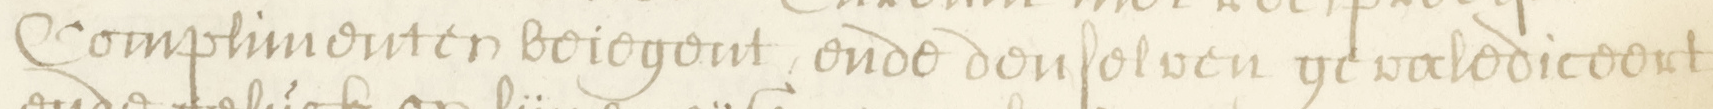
Complimenten beiegent, ende denselven gevalediceert
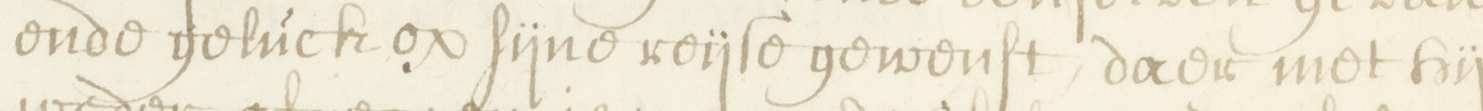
ende geluck op sijne reijse gewenst, daer met hij
